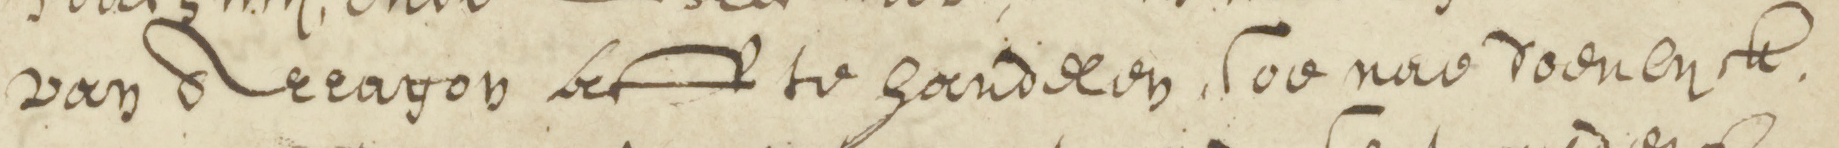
van Arragon aff te handelen, soe nae doenlyck,
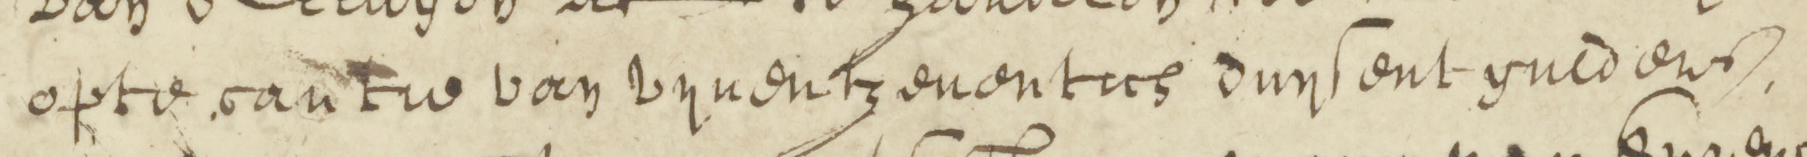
opte cautie van vyuentzeuentich duysent guldens,
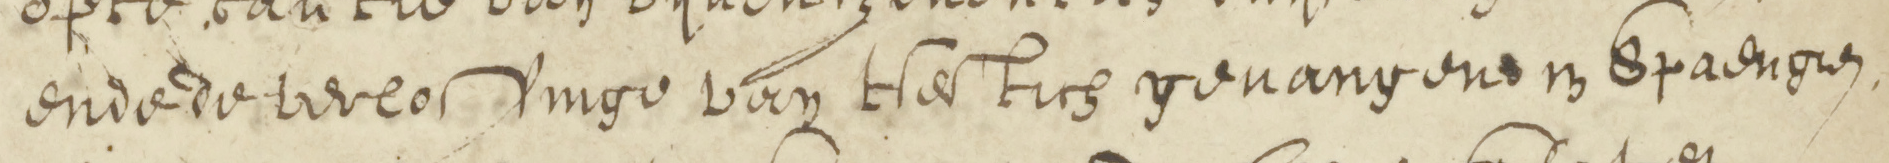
ende de verlossinge van tsestich geuangens in Spaengien,
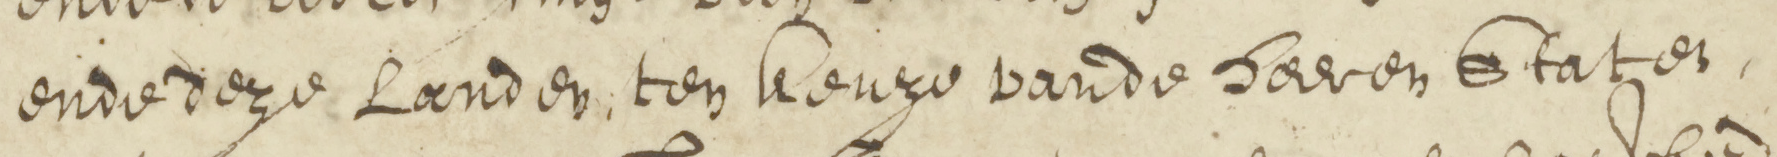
ende deze landen, ten keuze vande heeren Staten,
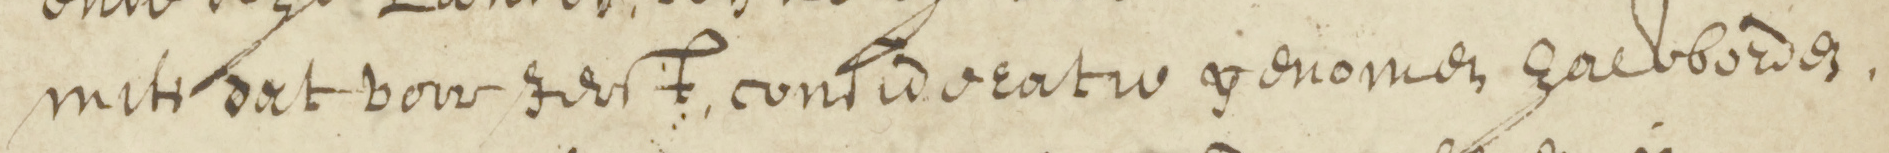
mits dat voir ierst consideratie genomen zal worden,
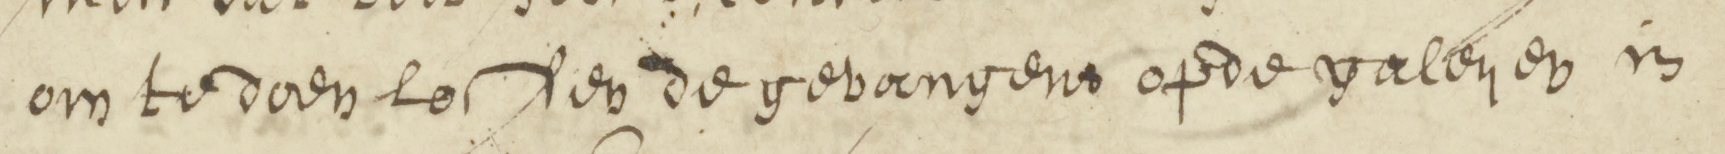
om te doen lossen de de gevangens opde galeyen in
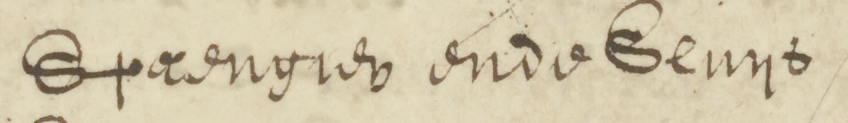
Spaengien ende Sluys.
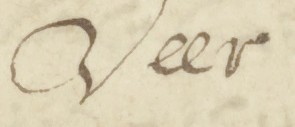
Veer
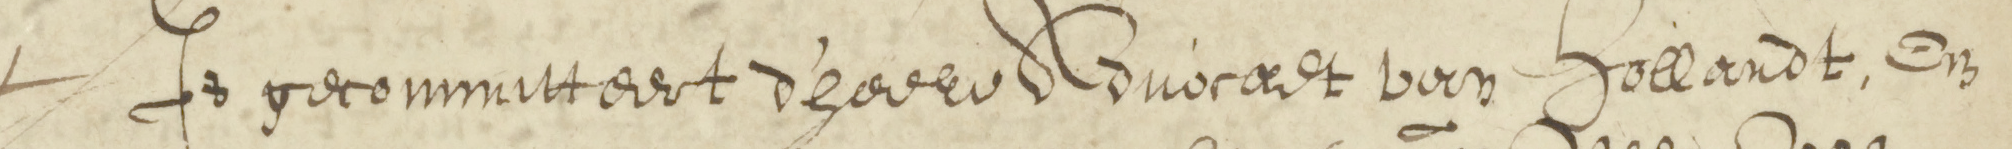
Is gecommitteert d'heere Aduocaet van Hollandt, om
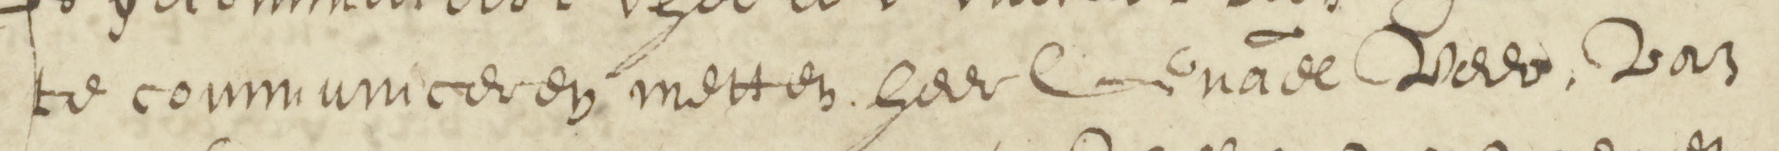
te communiceren metten heer Gnael Veer, van
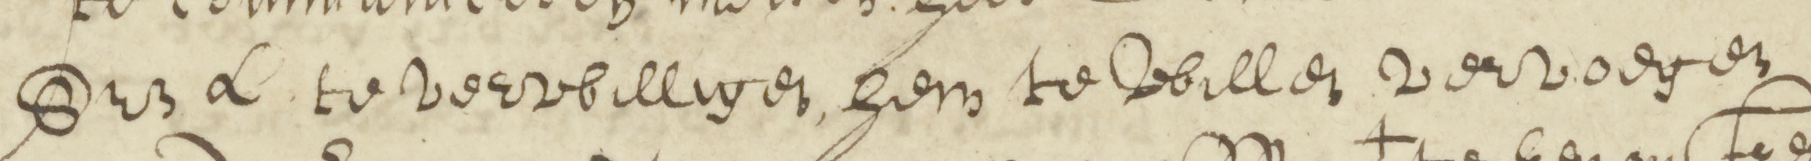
Syn L. te verwilligen, hem te willen vervoegen
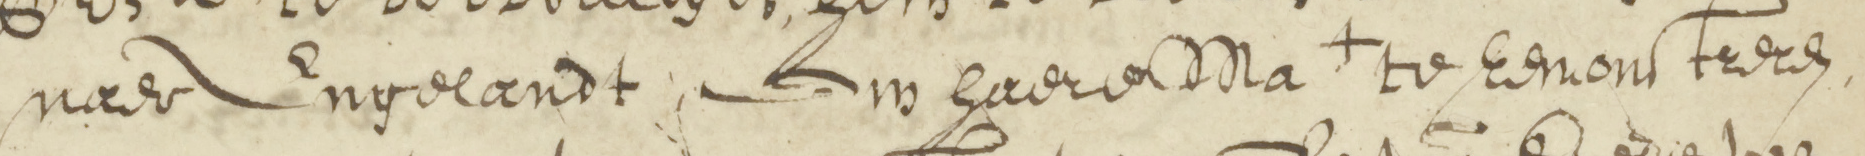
naer Engelandt, om haere Mat. te remonstreren,
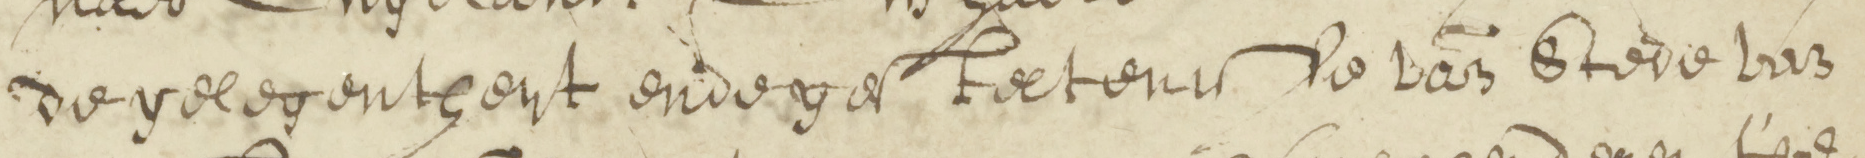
de gelegentheyt ende gesteltenisse van Stede van
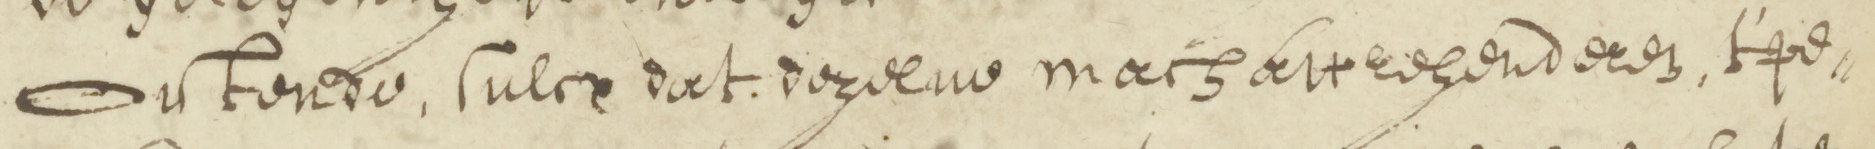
Oistende, sulcx dat dezelue mach apprehenderen, t'pe,,
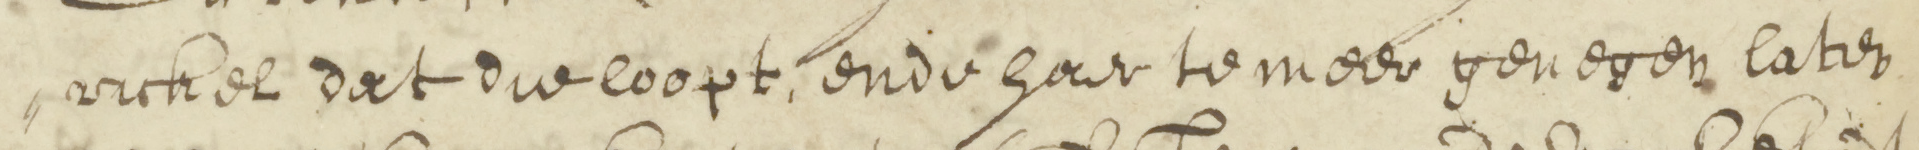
„rickel dat die loopt, ende haer te meer genegen laten
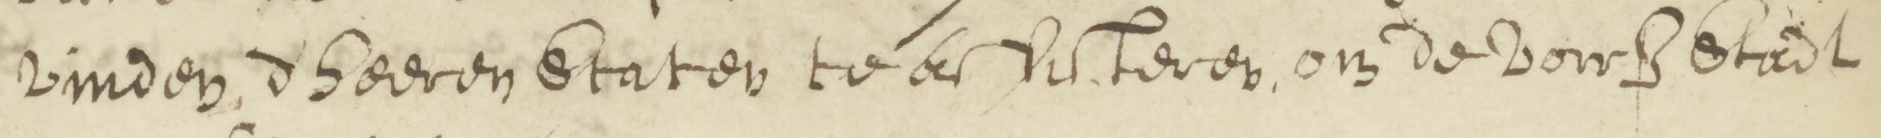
vinden, d'heeren Staten te assisteren, om de voirs Stadt
